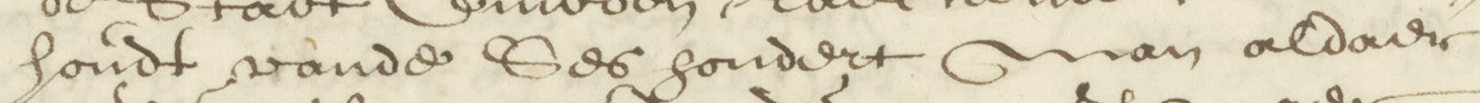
houdt vande Ses hondert man aldaer
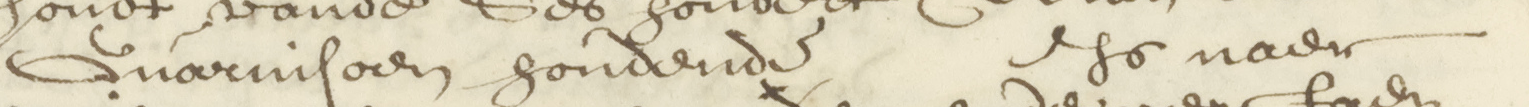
Guarnisoen houdende. Is naer
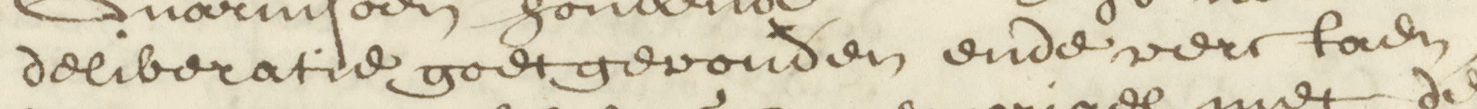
deliberatie goetgevonden ende verstaen
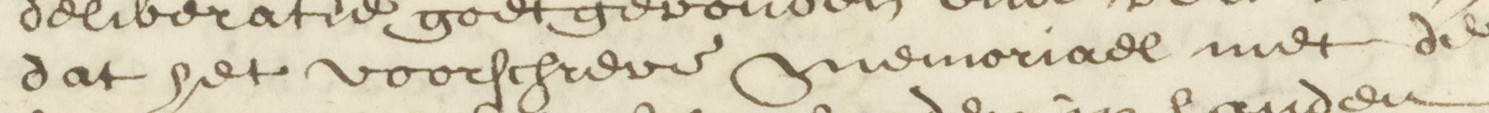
dat het voorschreve memoriael met de
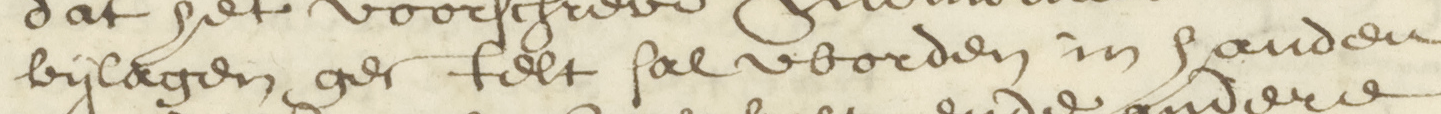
bijlagen gestelt sal worden in handen
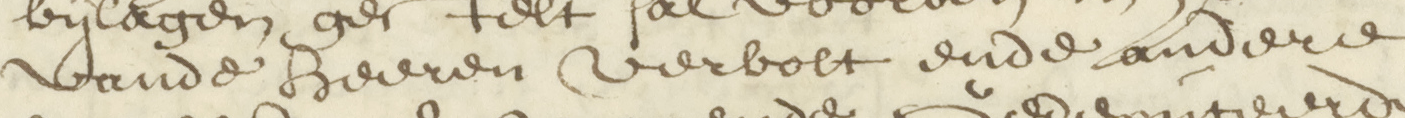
vande Heeren Verbolt ende andere
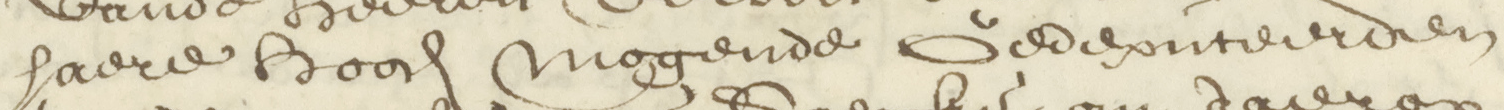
haere Hooch Mogende Gedeputeerden
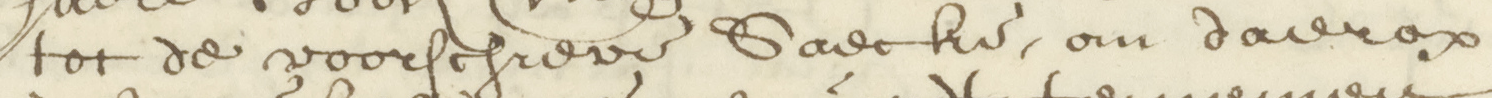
tot de voorschreve Saecke, om daerop
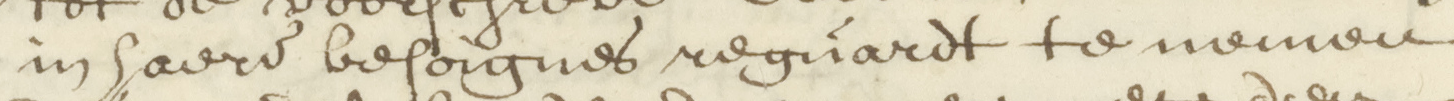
in haere besoignes reguardt te nemen
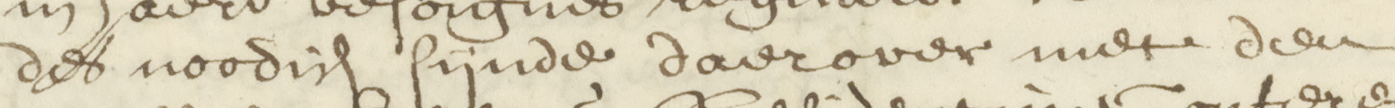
des noodich sijnde, daerover met den
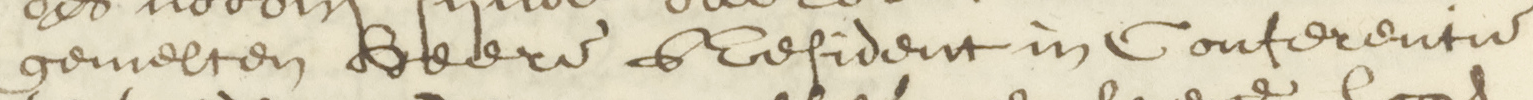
gemelten Heere Resident in Conferentie
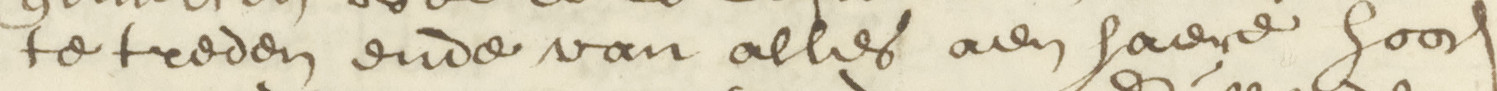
te treden ende van alles aen haere Hooch
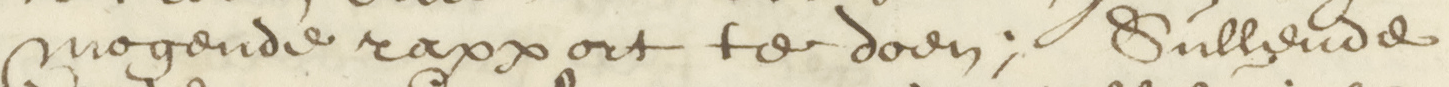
mogende rapport te doen; Sullende
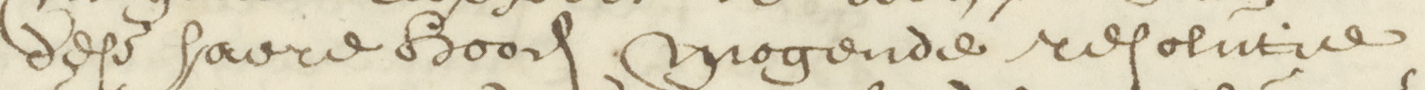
dese haere Hooch mogende resolutie
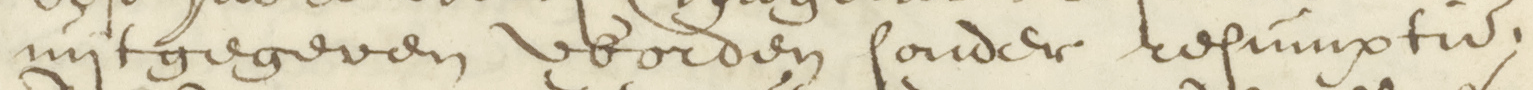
uijtgegeven worden sonder resumptie.
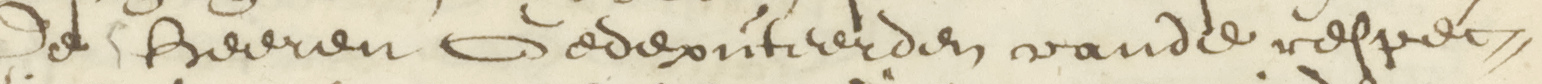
De Heeren Gedeputeerden vande respec„
